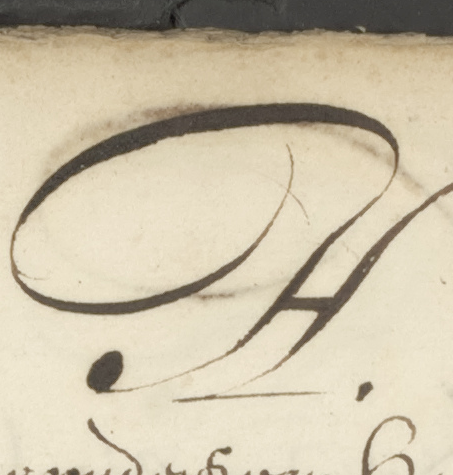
H.
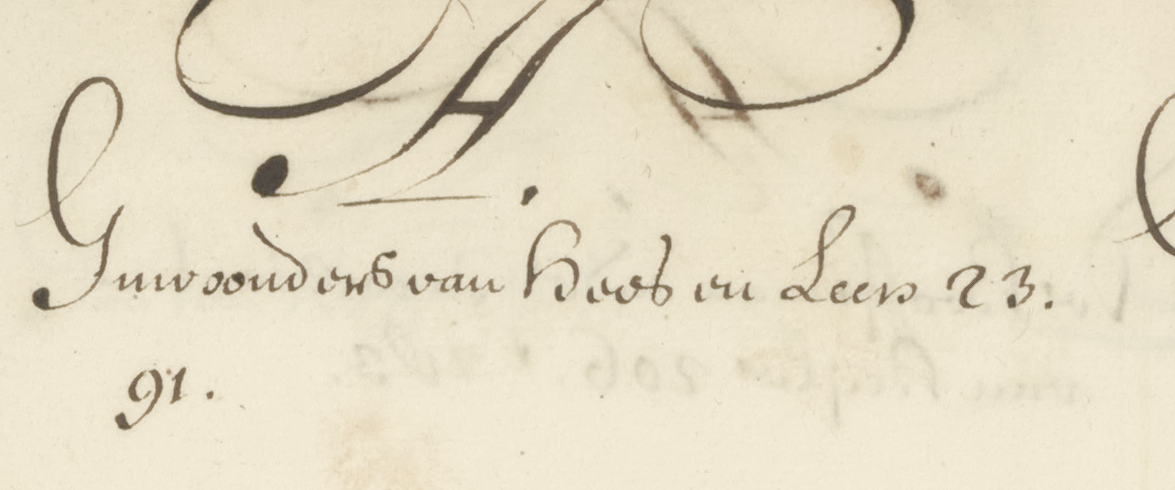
Inwoonders van Hees en Leen 23.
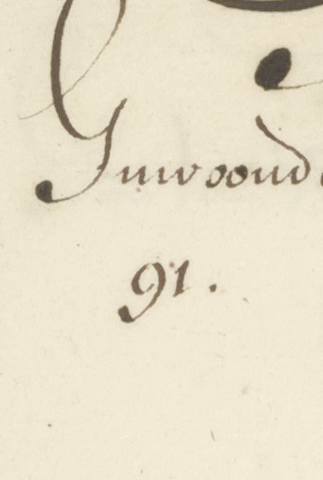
91.
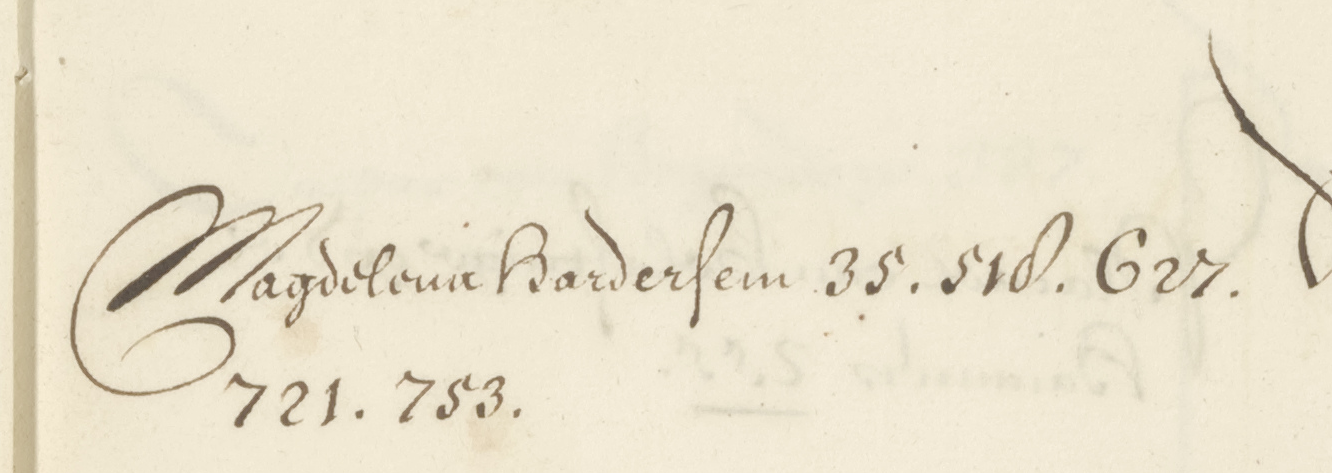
Magdelena Hardersem 35. 518. 627.
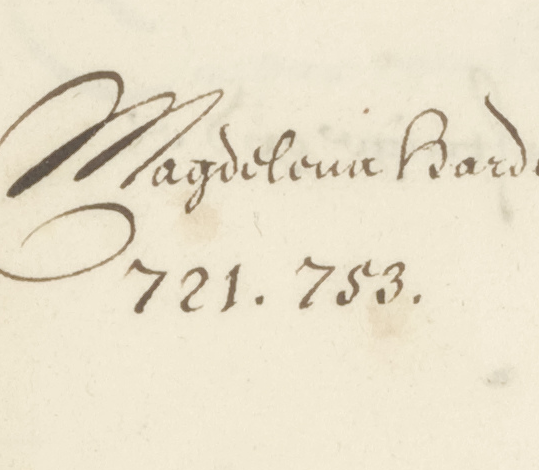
721. 753.
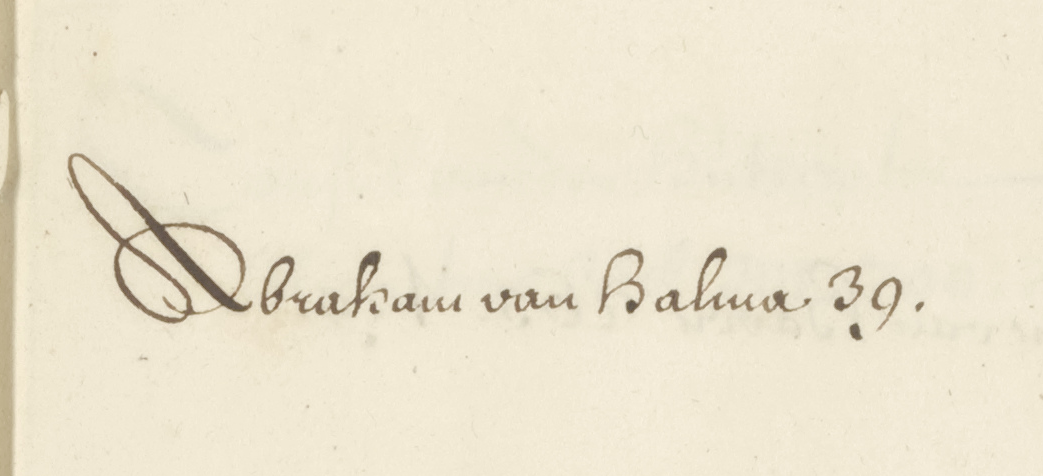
Abraham van Halma 39.
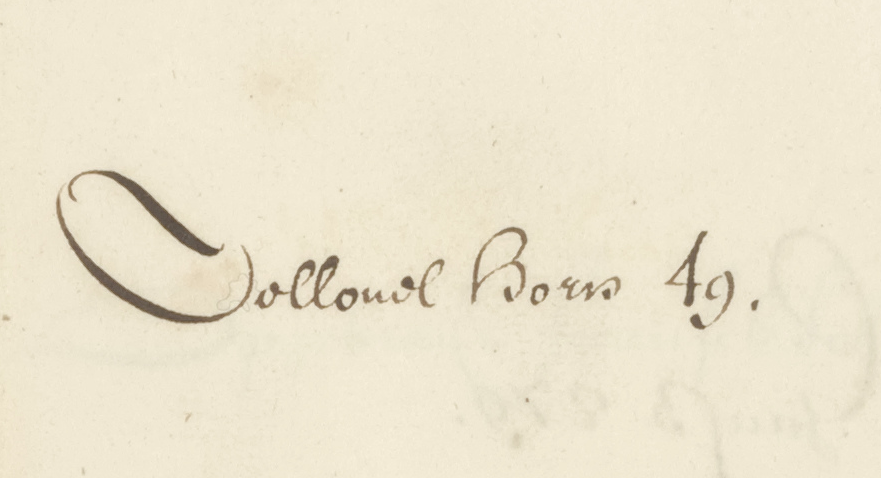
Collonel Horn 49.
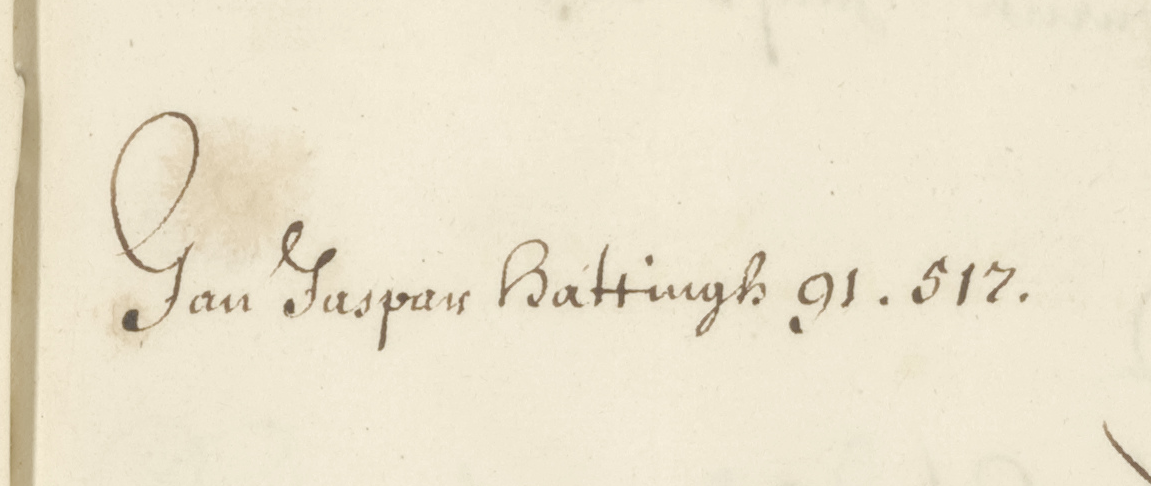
Jan Jaspar Hattingh 91. 517.
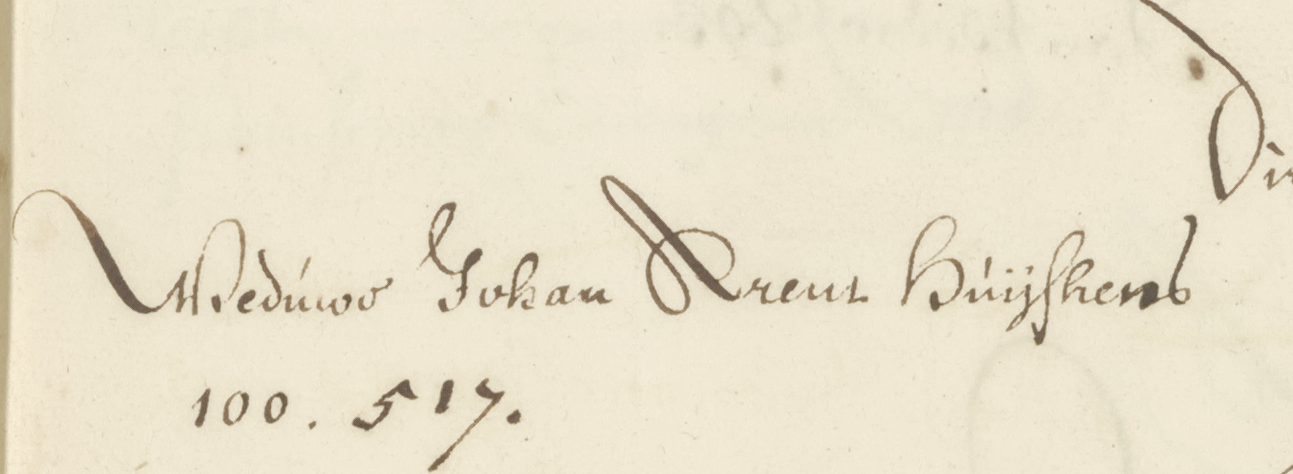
Weduwe Johan Arent Huijskens
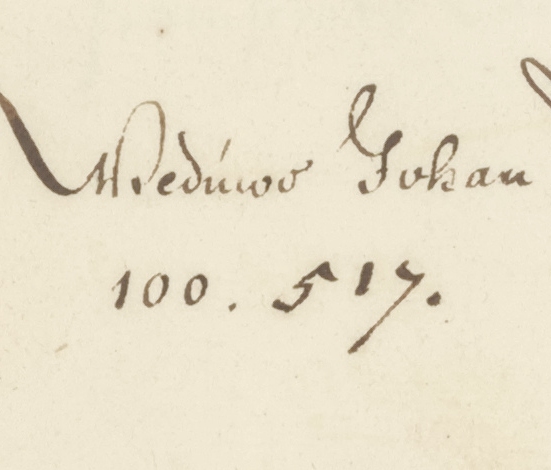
100. 517.
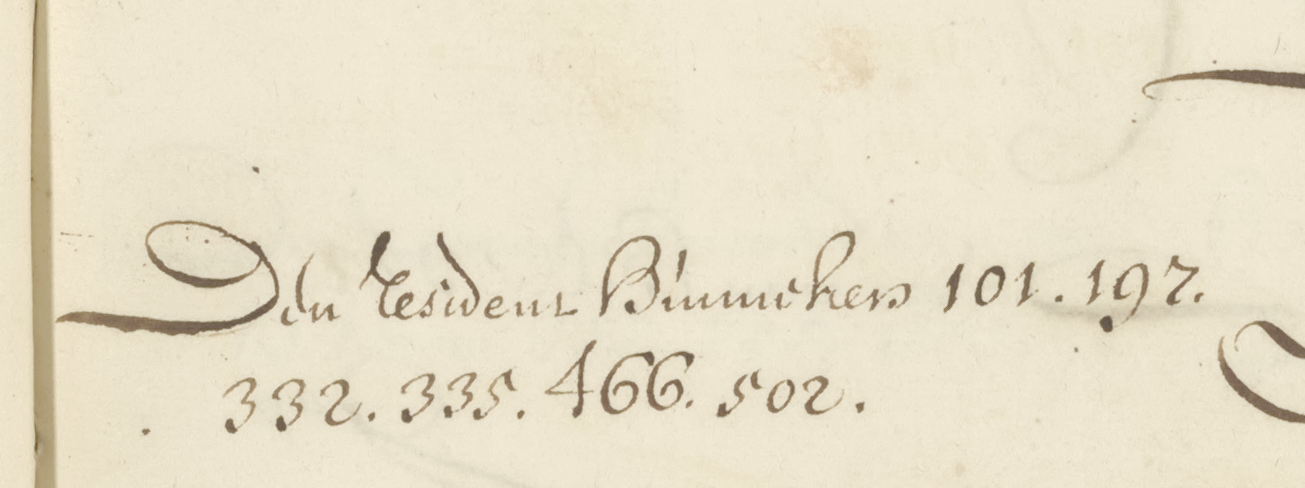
Den Resident Hunneken 101. 197.
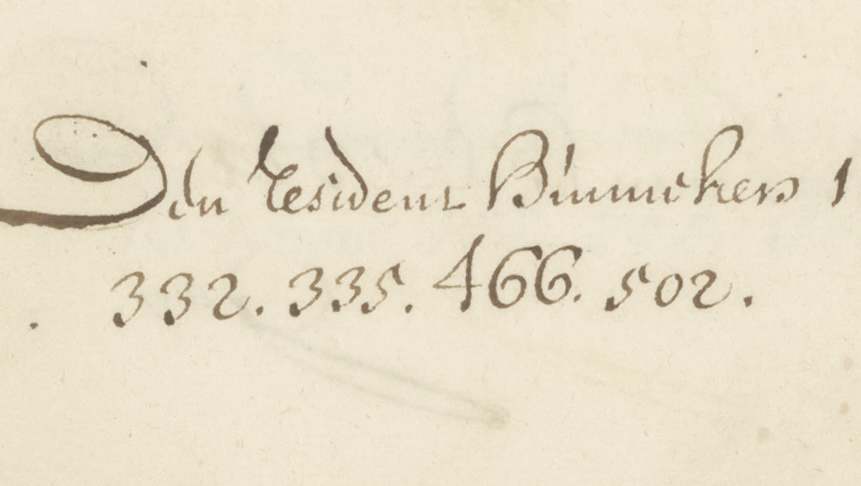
332. 335. 466. 502.
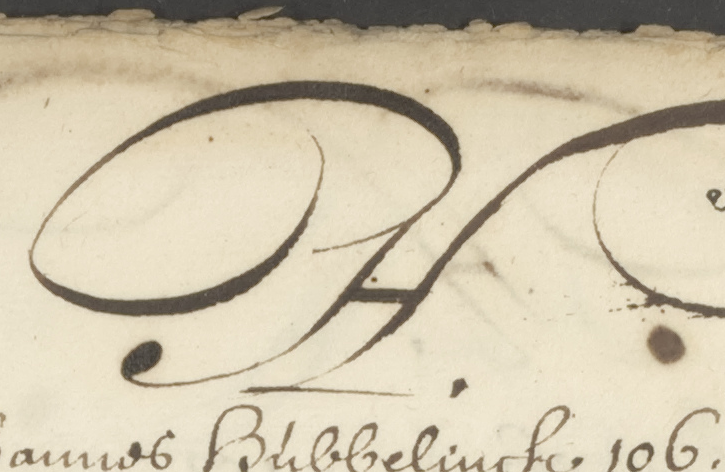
H.
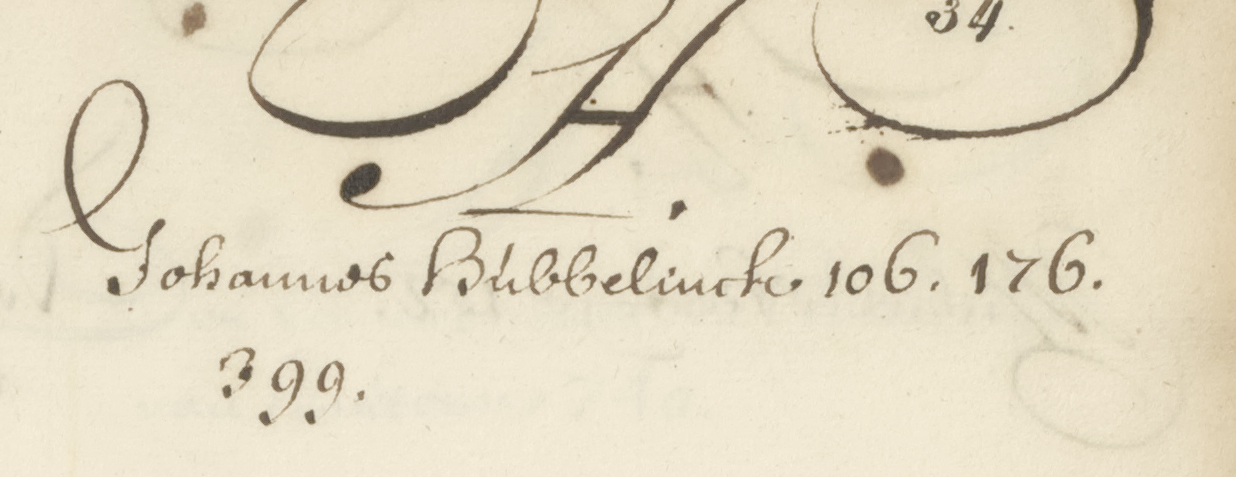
Johannes Hubbelinck 106. 176.
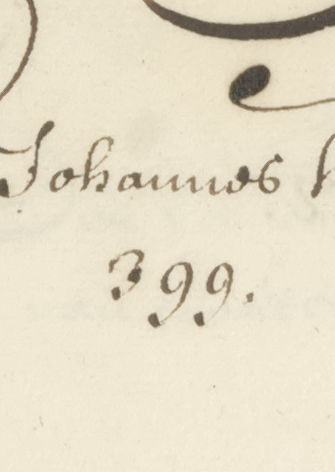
399.
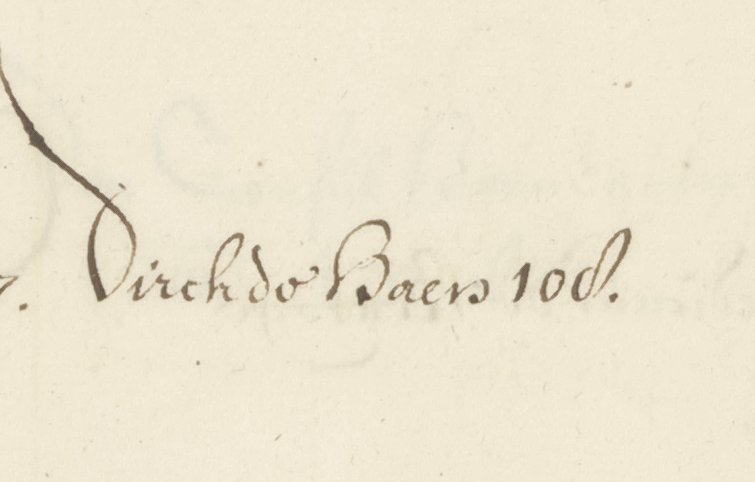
Dirck de Haen 108.
